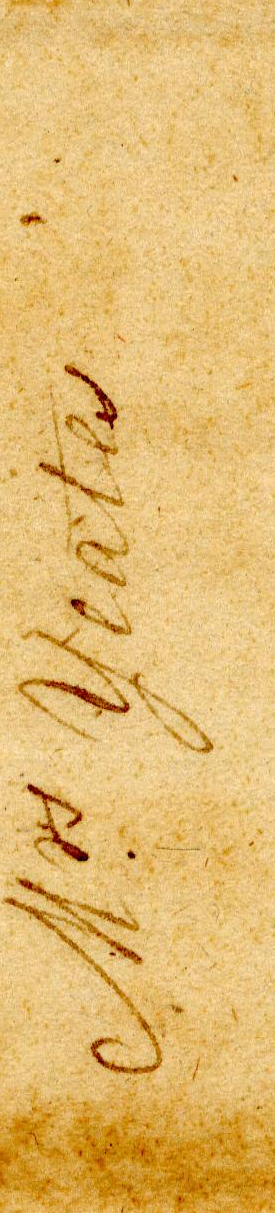M^rs. Yeates
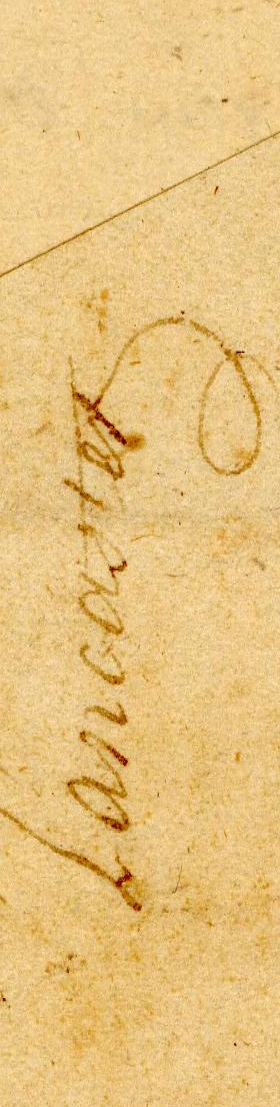Lancaster
